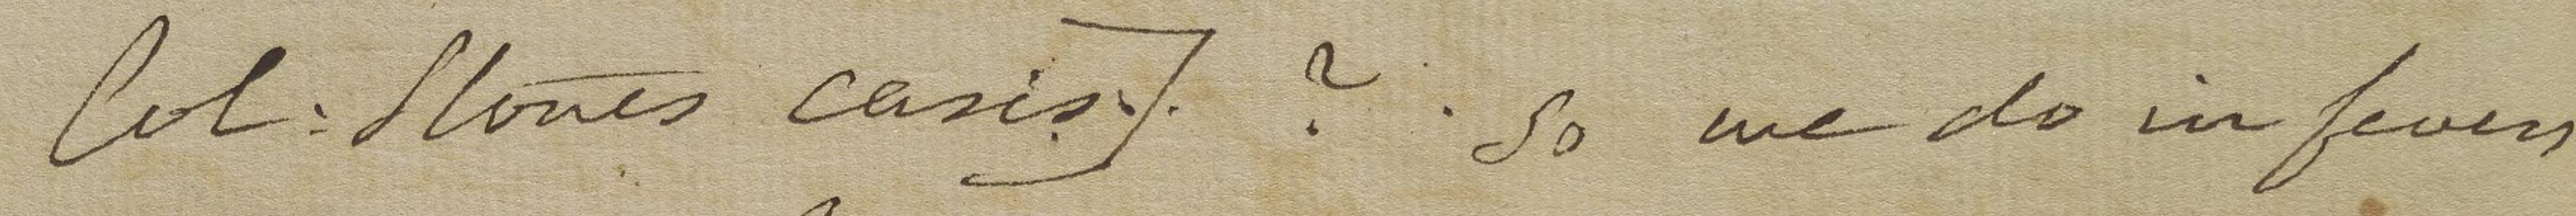Col. Sloves canis) ? So we do in fevers
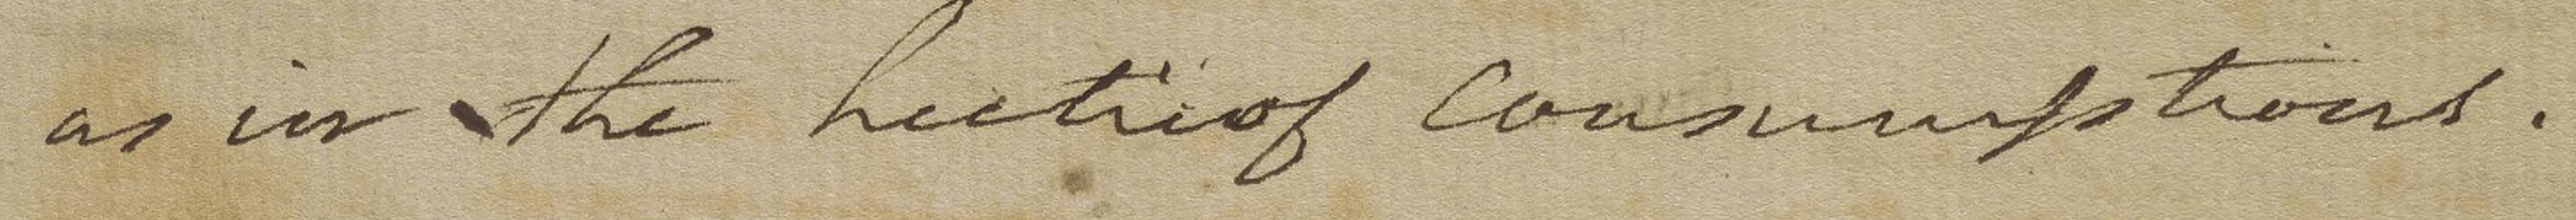as in the heat of consumptions.
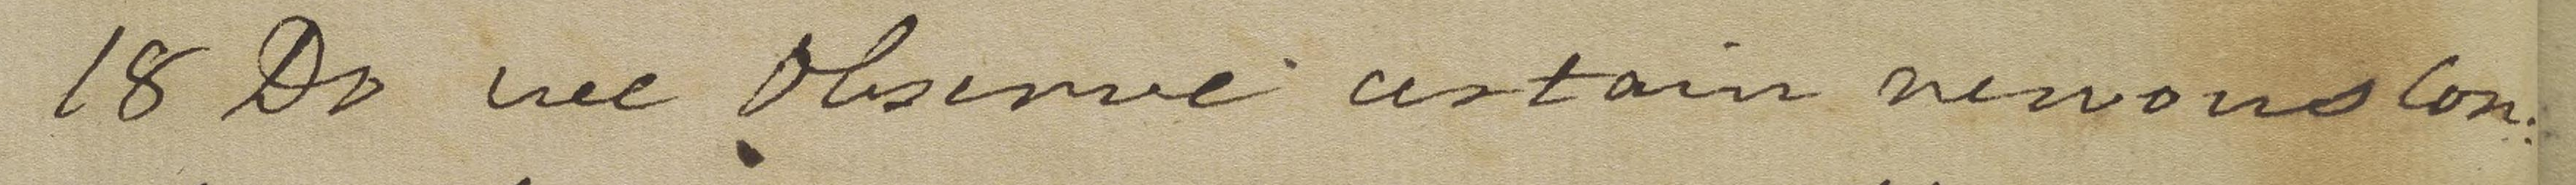18 Do we observe certain nervous con-
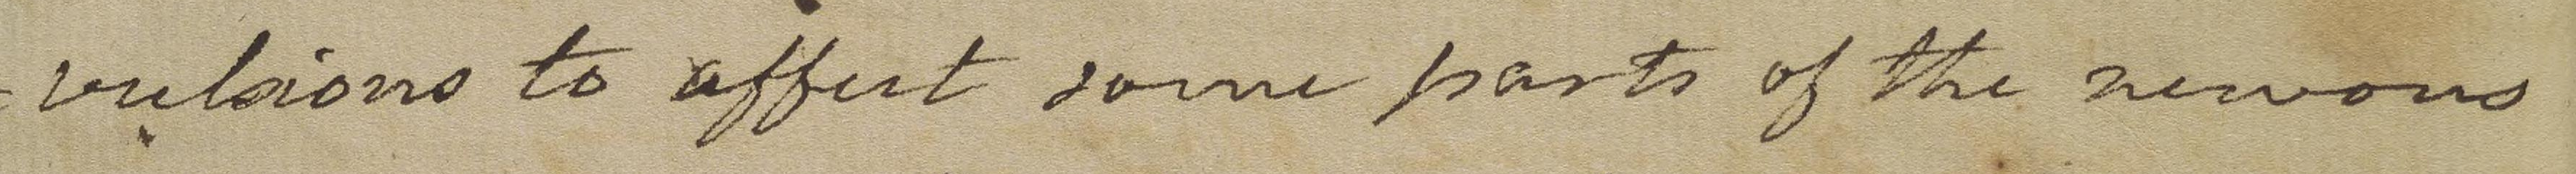-vulsions to affect some parts of the nervous
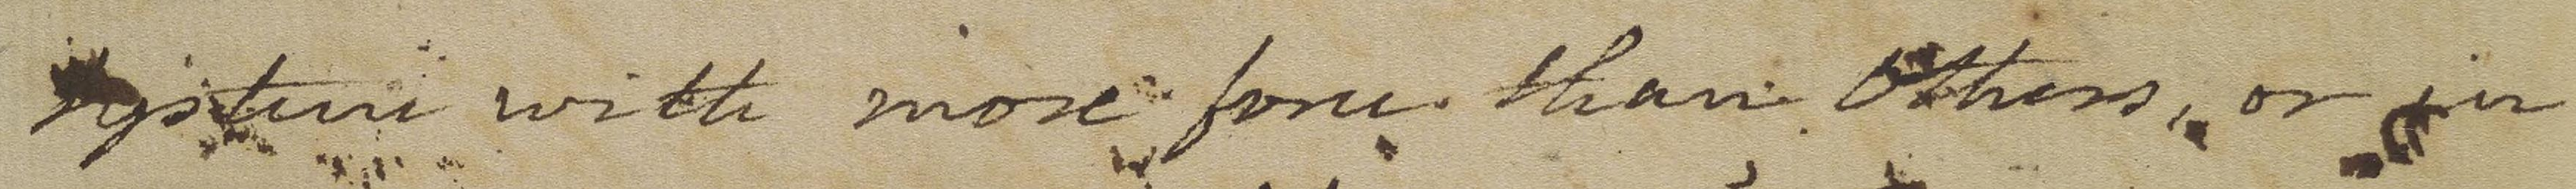system with more force than others, or in
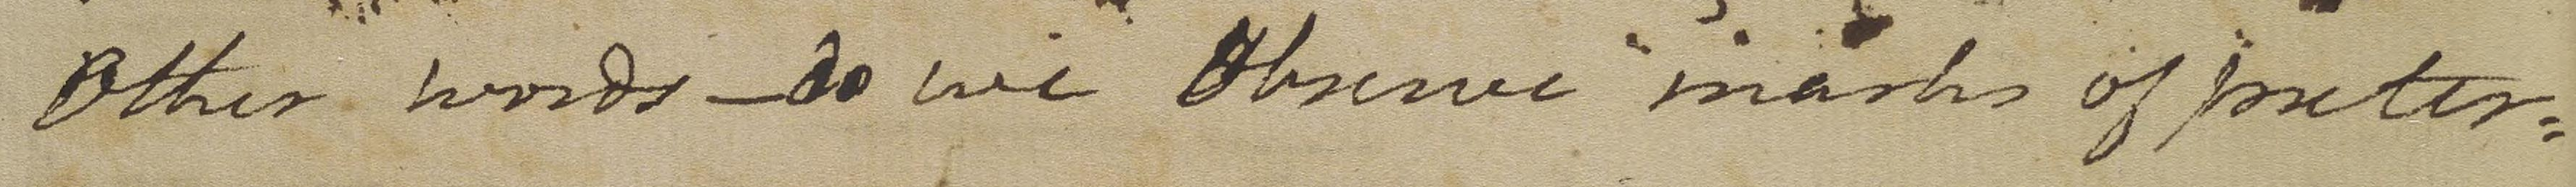other words, do we observe marks of preter-
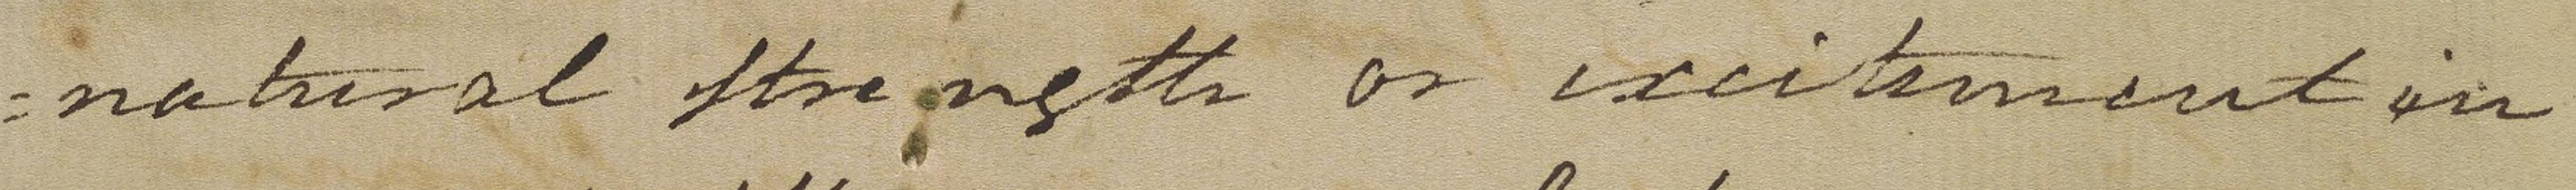natural strength or excitement in
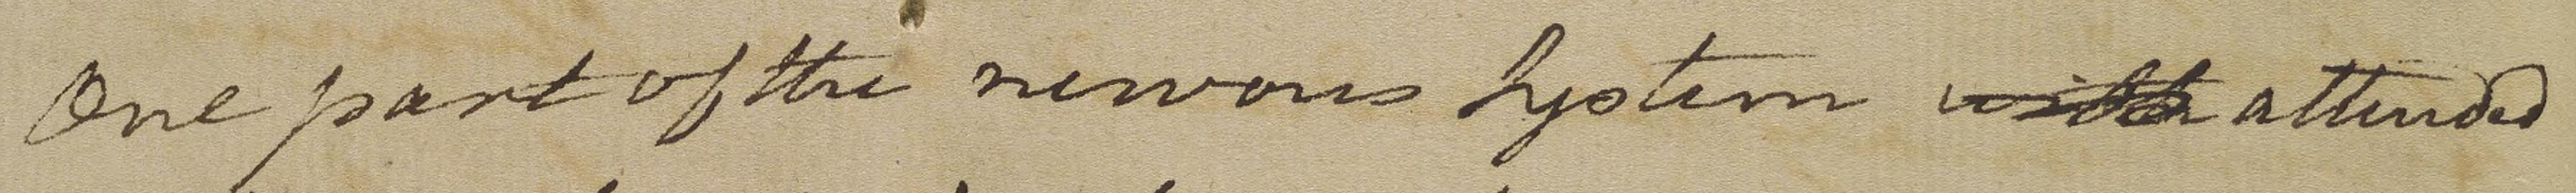one part of the nervous system [with] attended
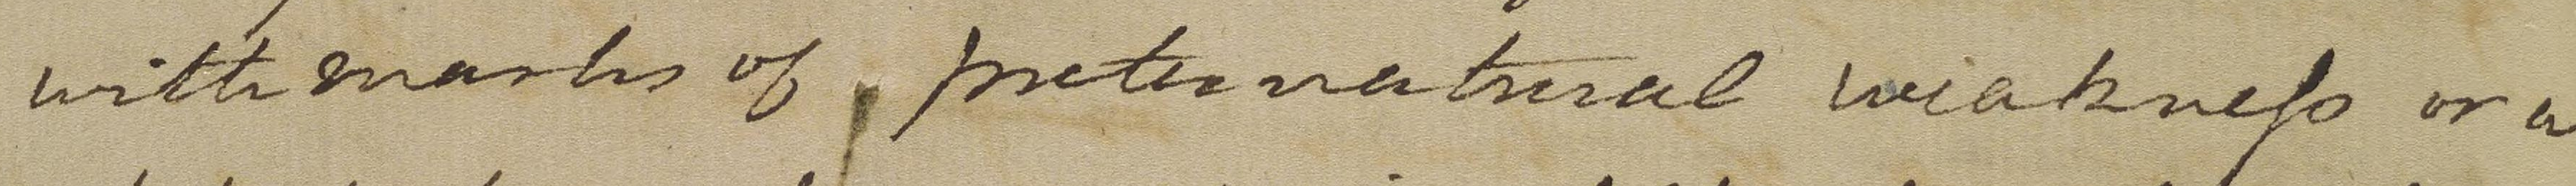with marks of preternatural weakness or a
